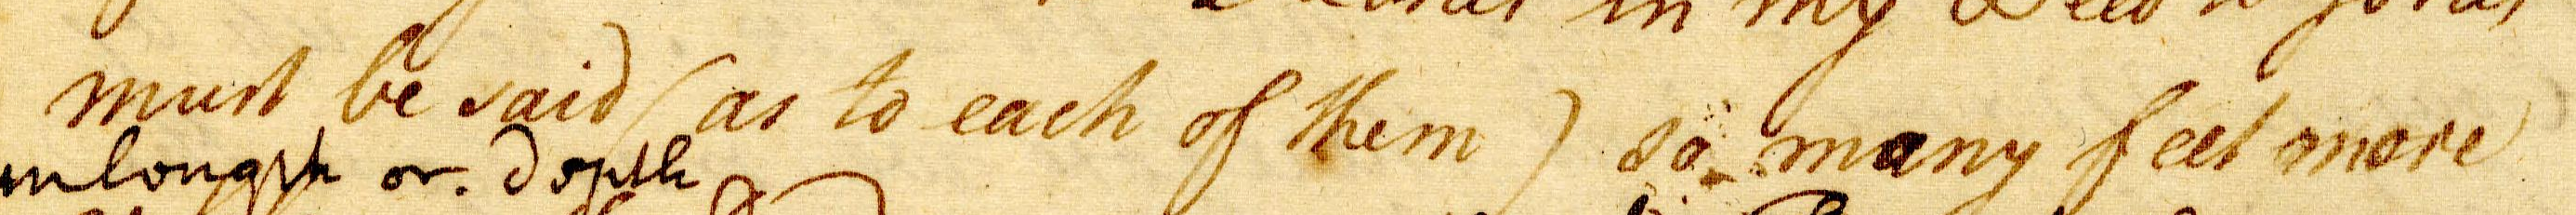must be said (as to each of them) so many feet more
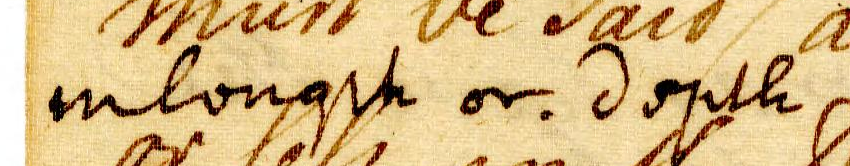in length or depth
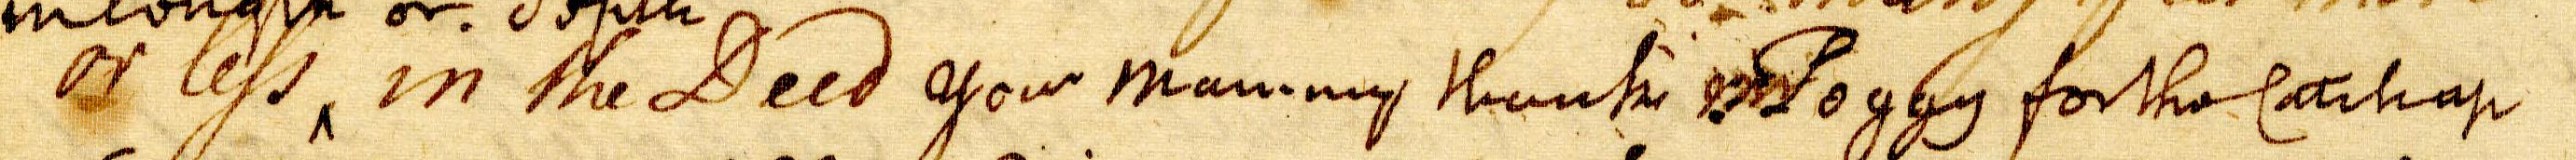or less ^in the Deed Your Mammy thanks Peggy for the Catchap
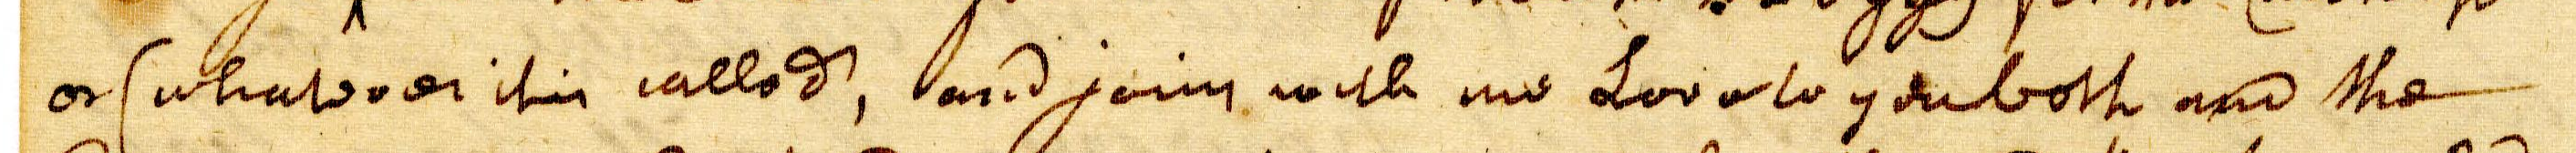or (whatever it is called, and joins with me Love to you both and the
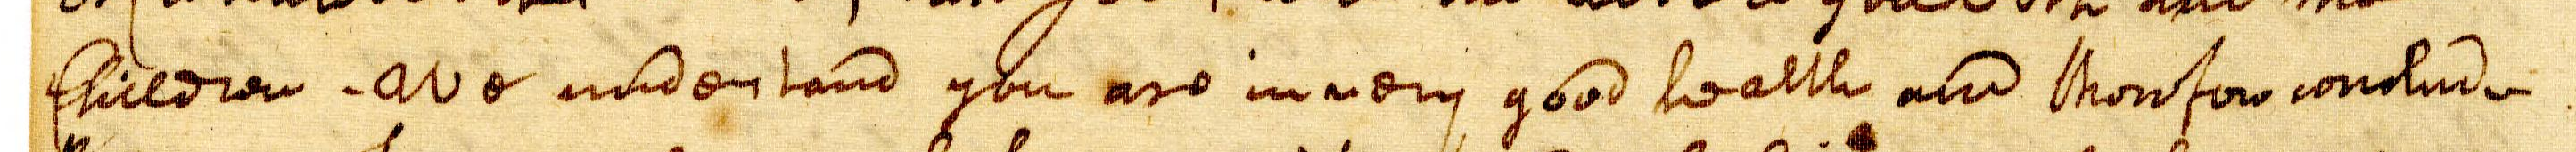Children -we understand you are in very good health and therefore conclude
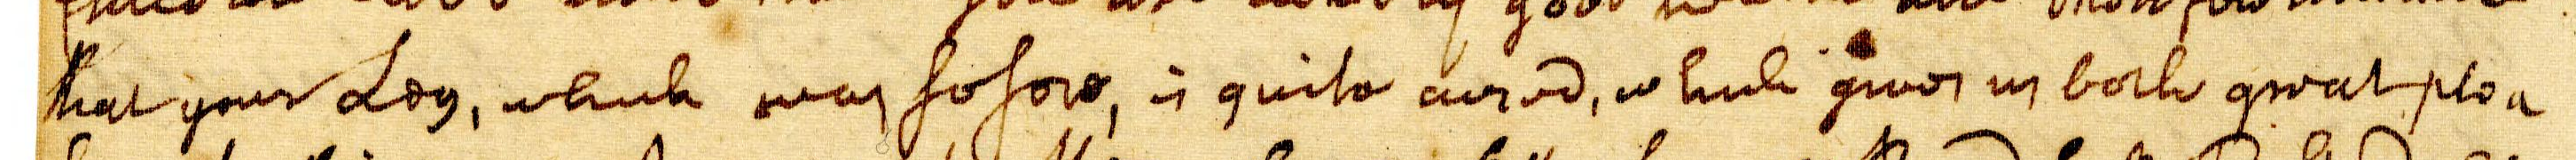that your Leg, which was so sore, is quite cured, which gives us both great plea
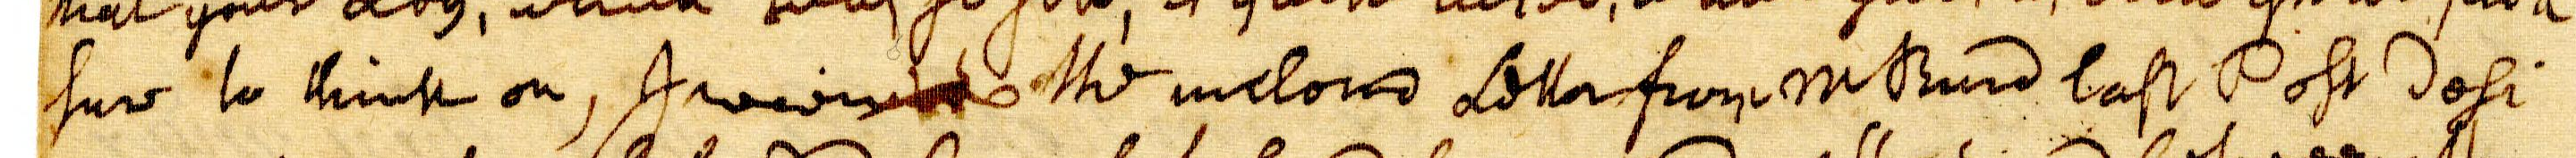sure to think on, I received the inclosd Letter from M Burd last Post desi
